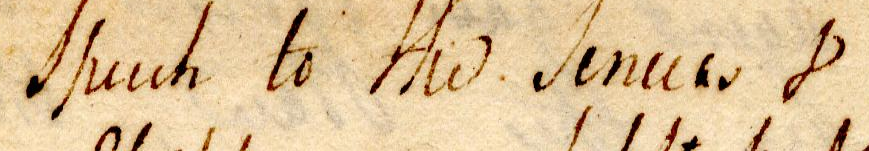Speech to the Senecas &
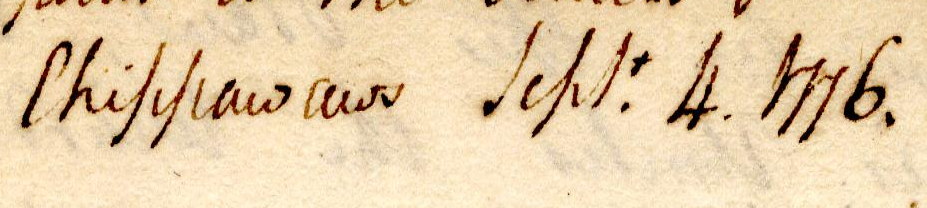Chippawaws Sep^r. 4. 1776
